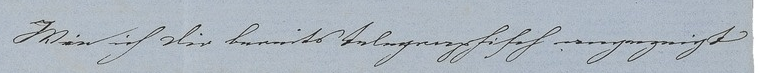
Wie ich Dir bereits telegraphisch angezeigt
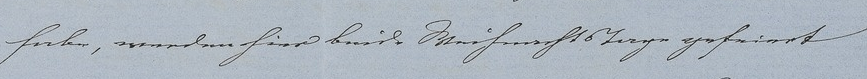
habe, werden hier beide WeihnachtsTage gefeiert
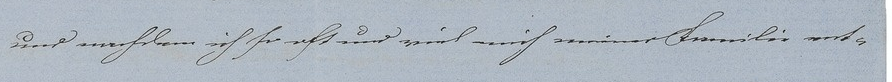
und nachdem ich so oft und viel mich meiner Familie ent-
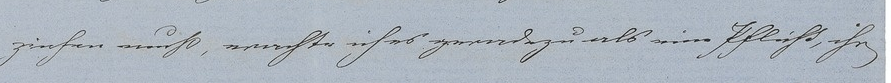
ziehen muß, erachte ich es geradezu als eine Pflicht, ihr
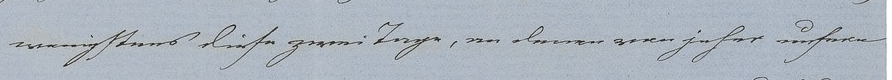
wenigstens diese zwei Tage, an denen von jeher unsere
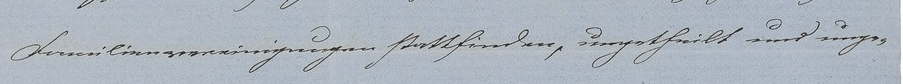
Familienvereinigungen stattfinden, ungetheilt und unge-
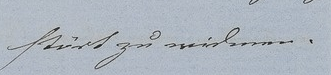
stört zu widmen.
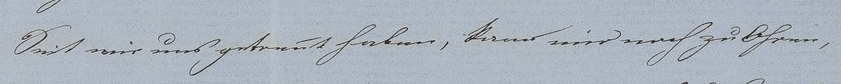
Seit wir uns getrennt haben, kam mir noch zu Ohren,
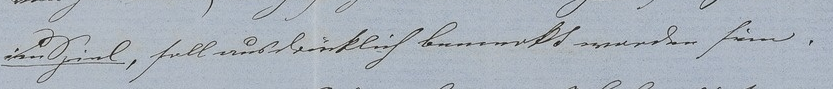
im Spiel, soll ausdrücklich bemerkt worden sein.
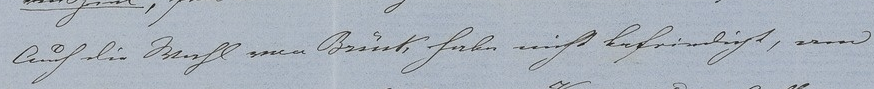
Auch die Wahl von Brück habe nicht befriedigt, am
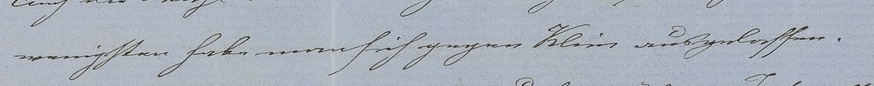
wenigsten habe man sich gegen Klein ausgelassen.
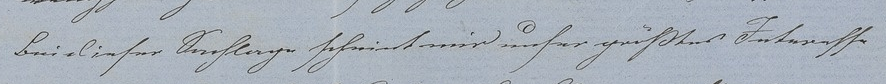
Bei dieser Sachlage scheint mir unser größtes Interesse
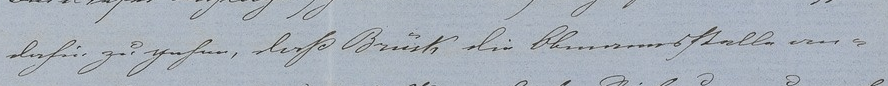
dahin zu gehen, daß Brück die Obmannsstelle an-
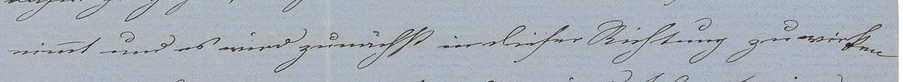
nimmt und es wird zunächst in dieser Richtung zu wirken
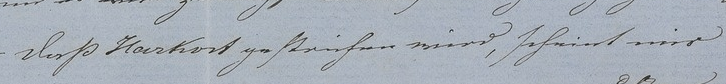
Daß Harkort gestrichen wird, scheint mir
